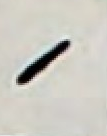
1
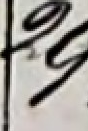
29
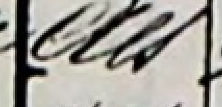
Alt
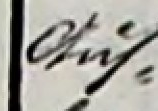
Aus„
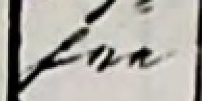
see
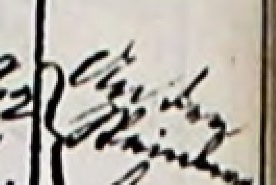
An der
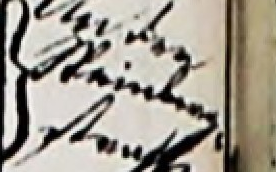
Steinberg„
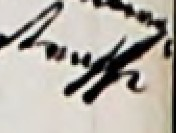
strasse
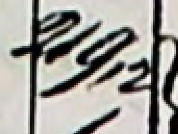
219,2
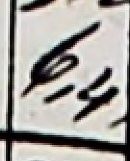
6,4
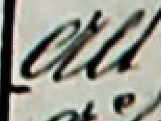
Alt
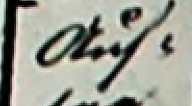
Aus„
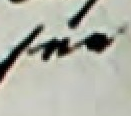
see
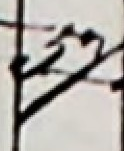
57
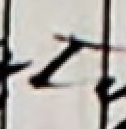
I
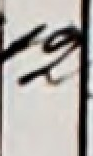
12
